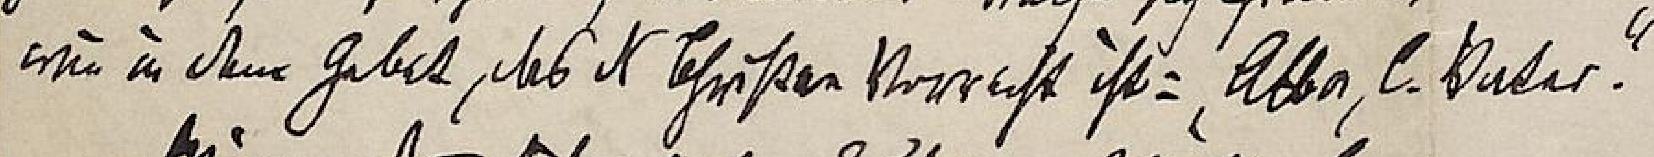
wie in dem Gebet, das des Christen Vorrecht ist: "Abba, l. Vater."
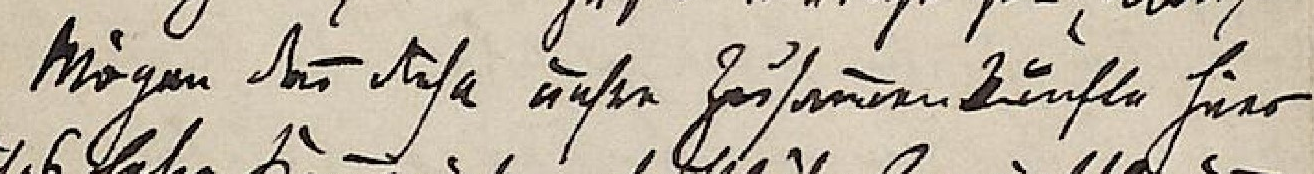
Mögen den diese unser Zusamenkünfte hier
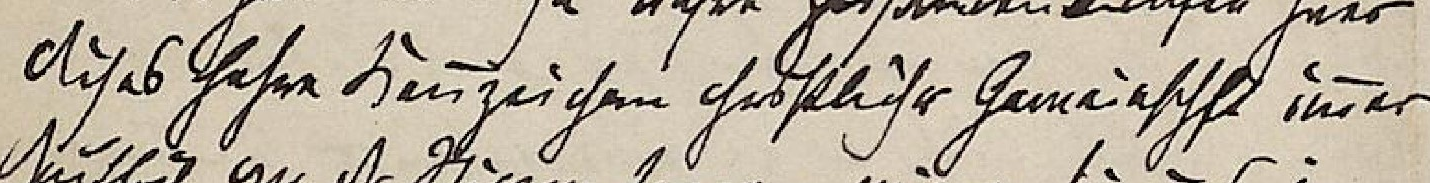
dieses hohe Kenzeichen christlicher Gemeinschaft imer
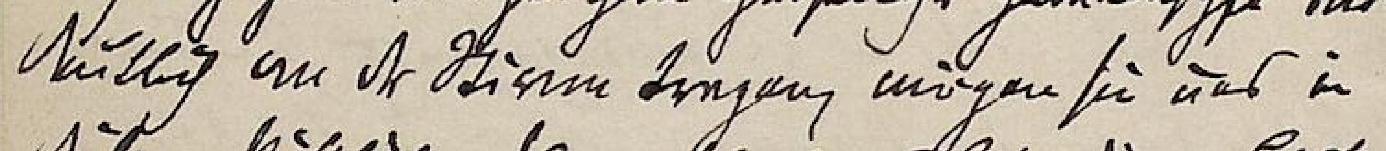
deutlich an der Stirn tragen, mögen sie uns in
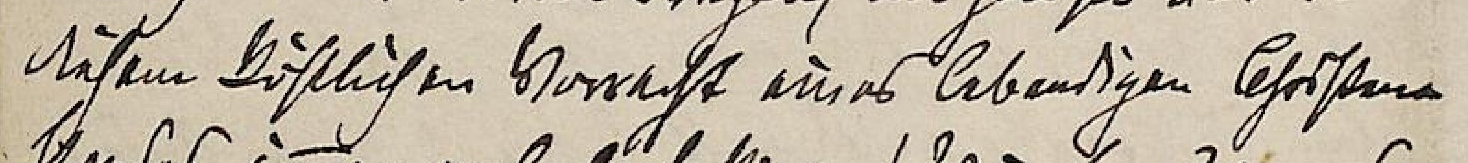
diesem köstlichen Vorrecht eines lebendigen Christen¬
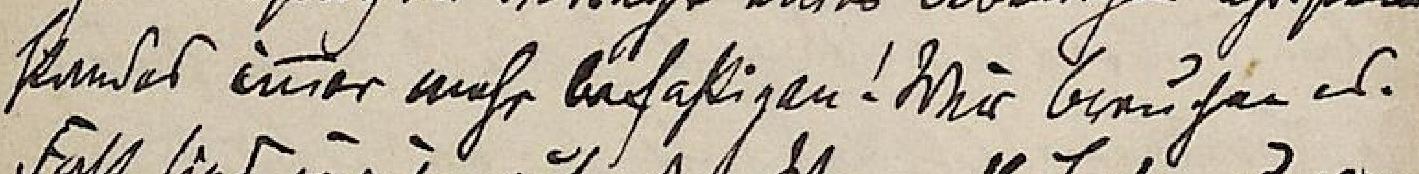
standes imer mehr befestigen! Wir brauchen es.
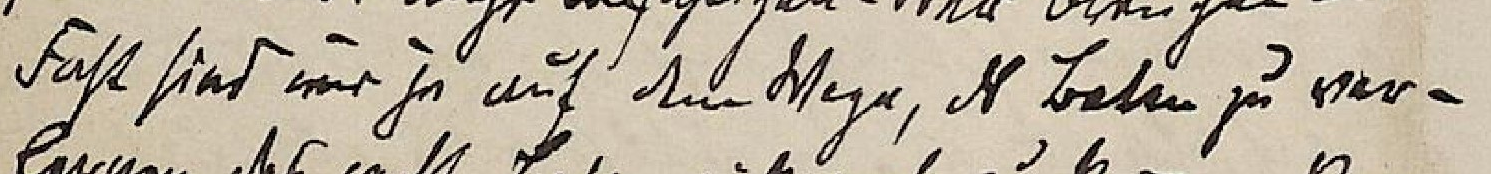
Fast sind wir ja auf dem Wege, das Beten zu ver¬
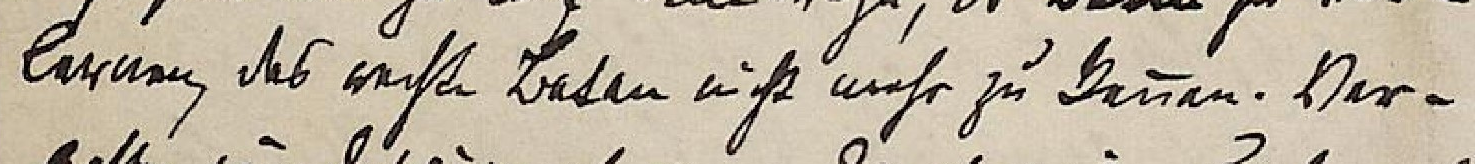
lernen, das rechte Beten nicht mehr zu kenen. Ver¬
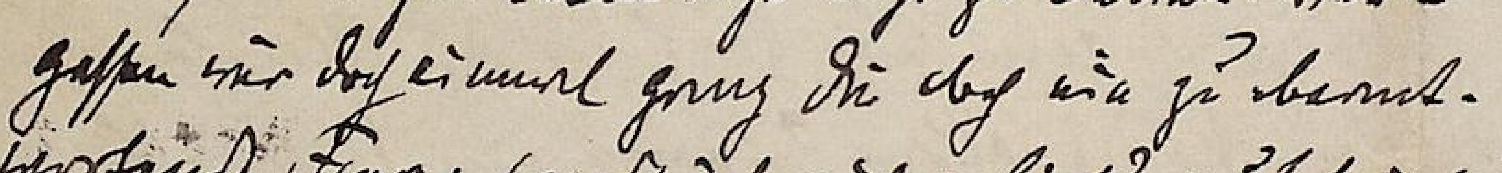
gessen wir doch einmal ganz die doch nie zu beant¬
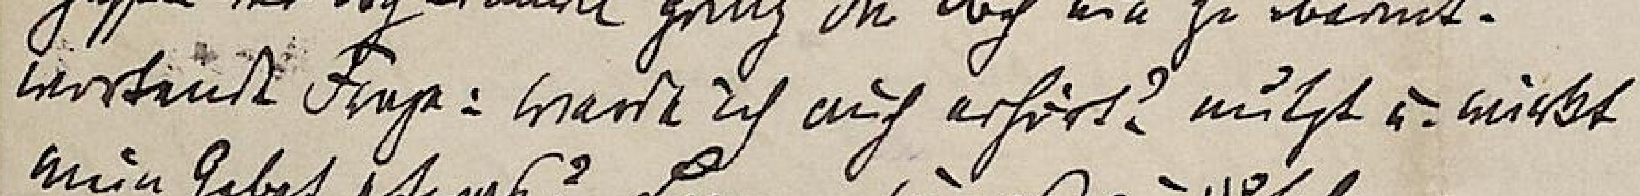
wortende Frage: werde ich auch erhört? nutzt u. wirkt
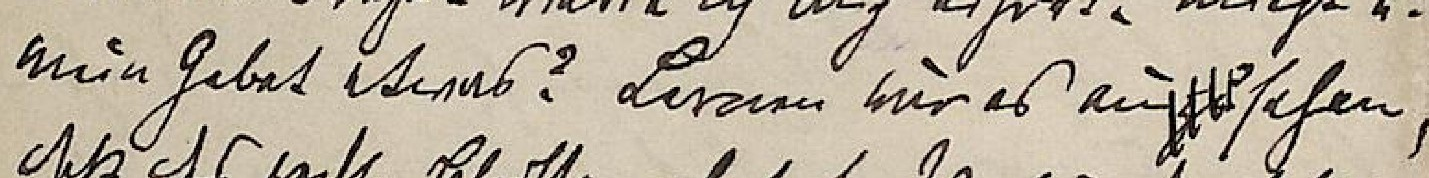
ein Gebet etwas? Lernen wir es einzusehen,
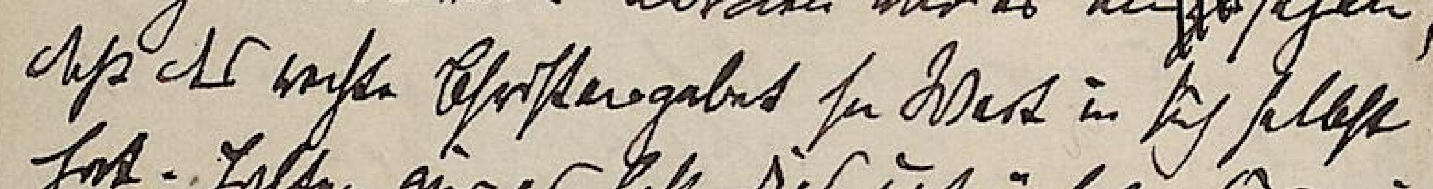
daß das rechte Christengebet sn Wert in sich selbst
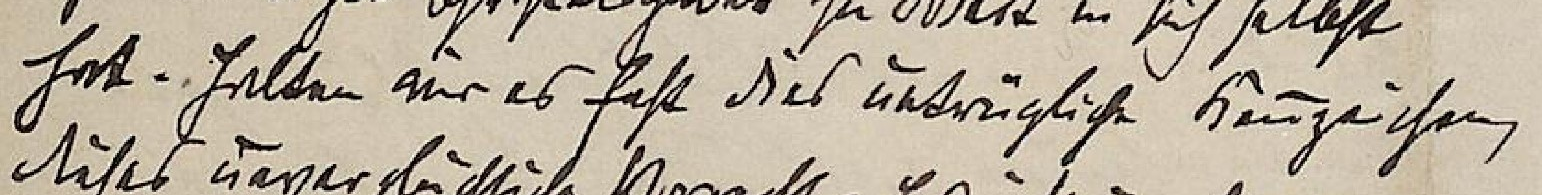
hat. Halten wir es fest das untrügliche Kenzeichen,
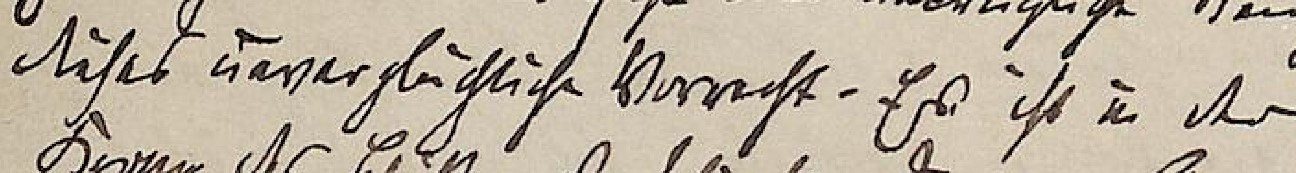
dieses unvergleichliche Vorrecht. Es ist in der
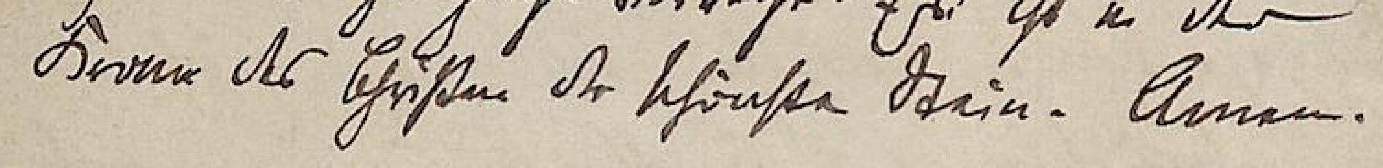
Krone des Christen der schönsten Stein. Armen
